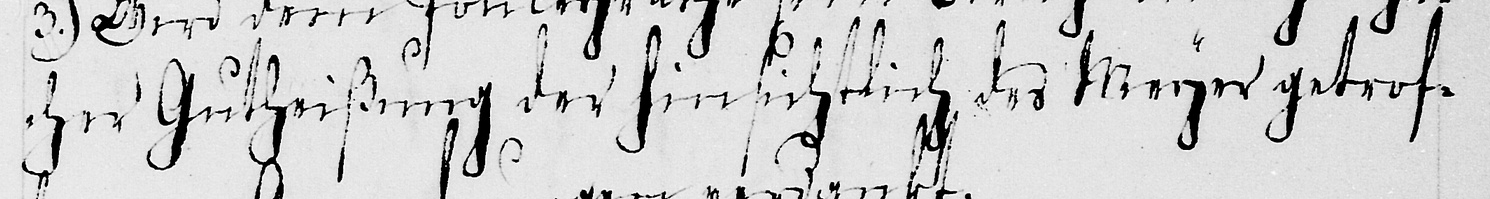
cher Gutheißung der hinsichtlich des Meyer getrof¬
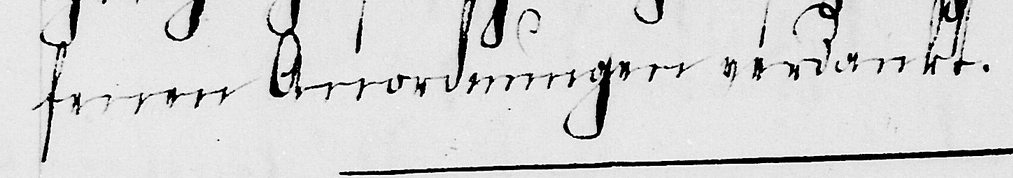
fenen Anordnungen verdankt.
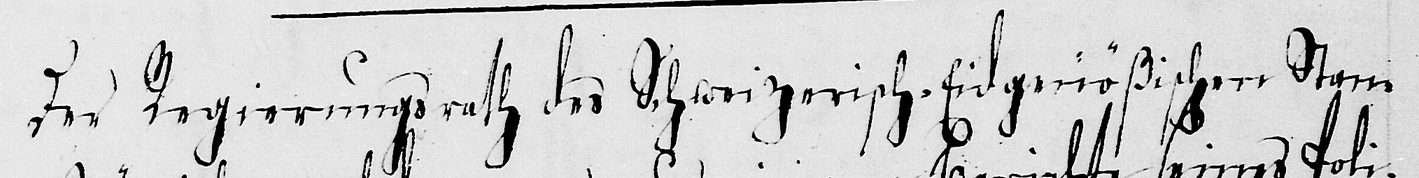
Der Regierungsrath des Schweizerisch-Eidgenößischen Stan¬
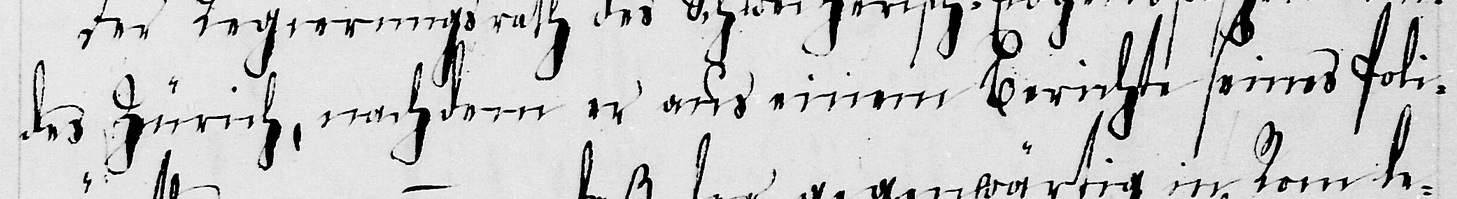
des Zürich, nachdem er aus einem Berichte seines Poli¬
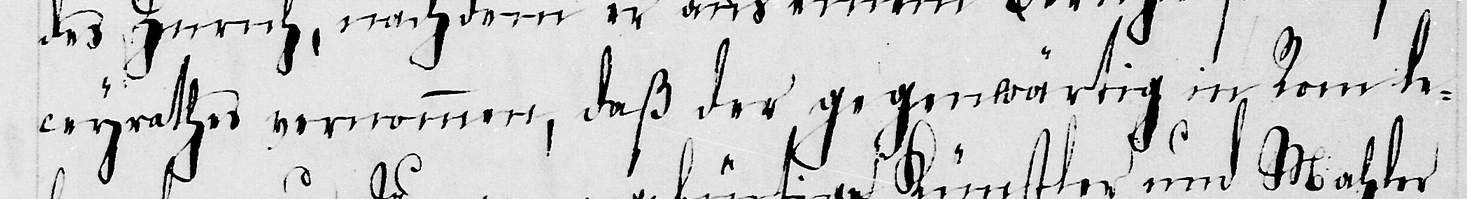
ceyrathes vernommen, daß der gegenwärtig in Rom le¬
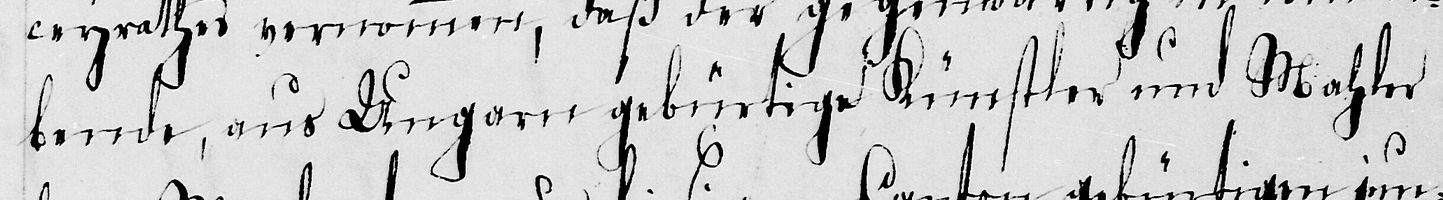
bende, aus Ungarn gebürtige Künstler und Mahler
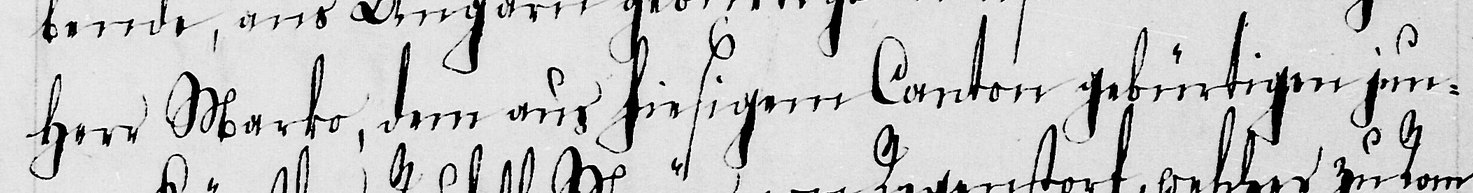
Herr Marko, dem aus hiesigem Canton gebürtigen jun¬
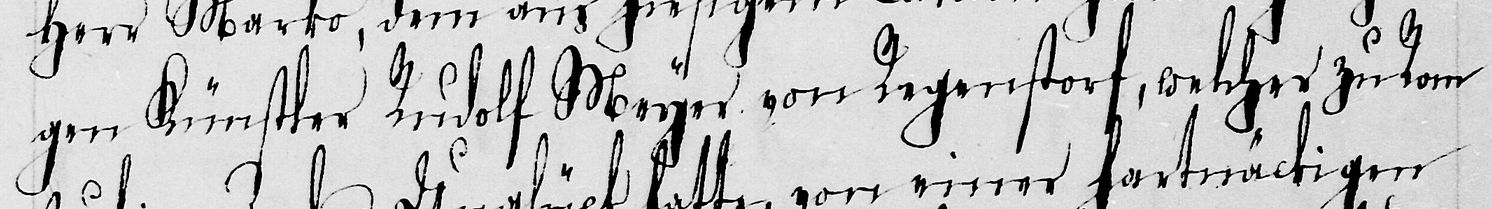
gen Künstler Rudolf Meyer von Regenstorf, welcher zu Rom
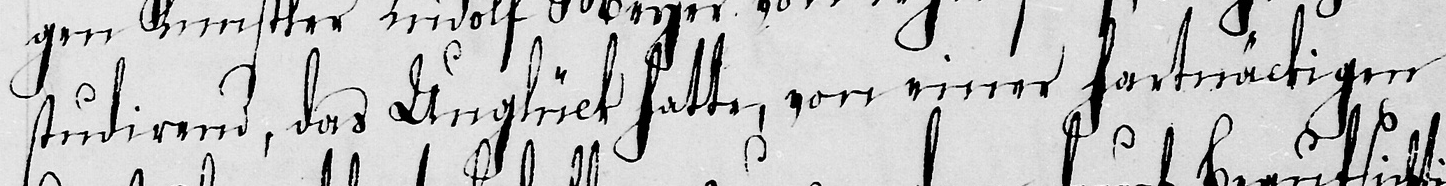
studierend, das Unglück hatte, von einer hartnäckigen
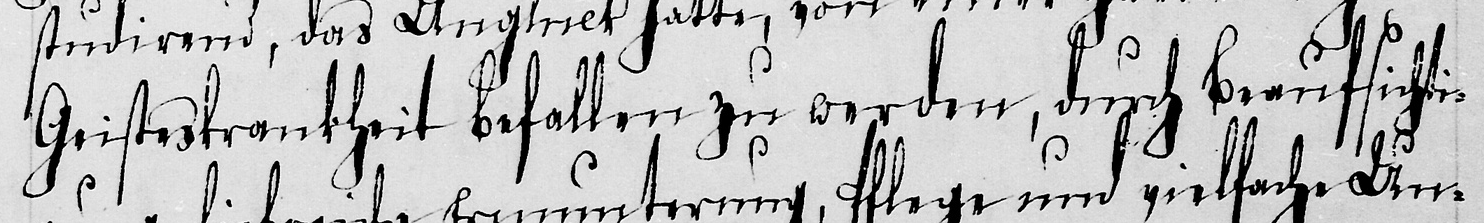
Geisteskrankheit befallen zu werden, durch Beaufsicht¬
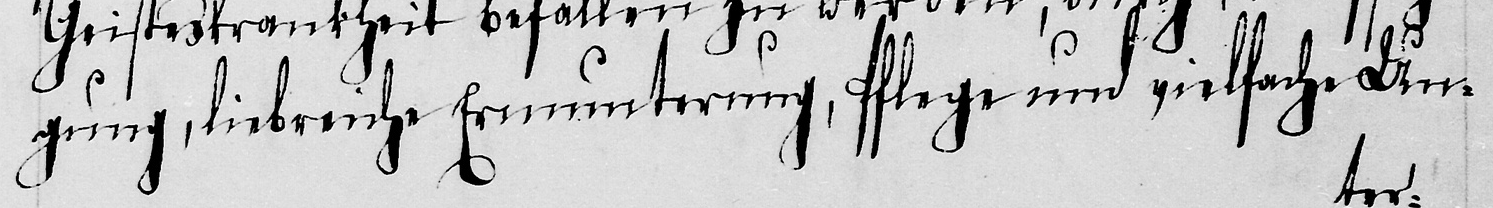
igung, liebreiche Ermunterung, Pflege und vielfache Un-
